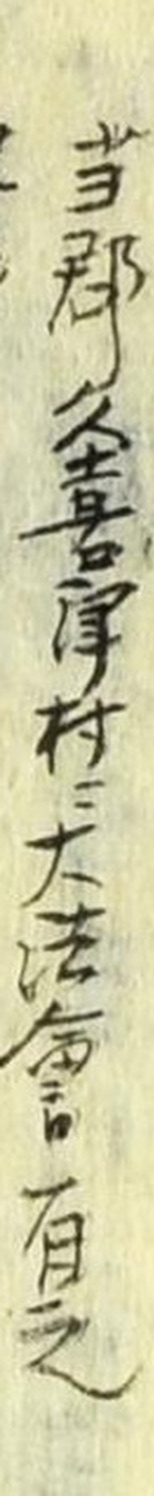当郡久喜津村ニ大法会有之
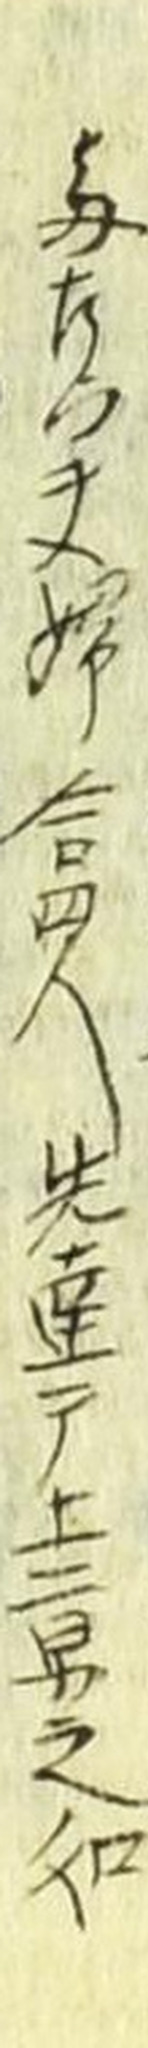当左衛門夫婦合四人先達テ上京之処
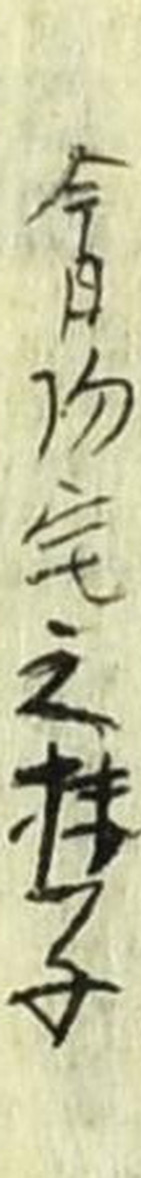今日帰宅之様子
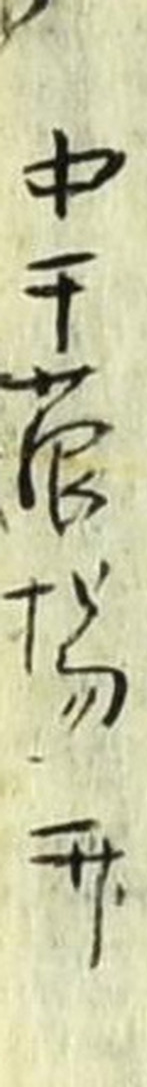中干菔揚竹
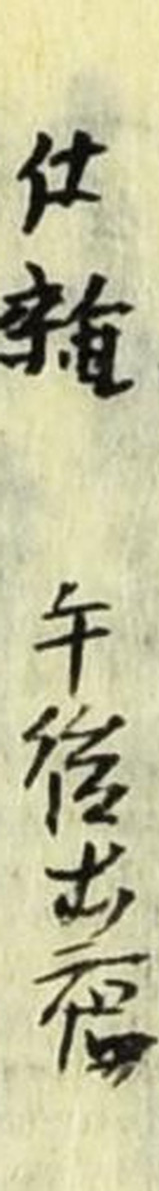仕雑午後出福
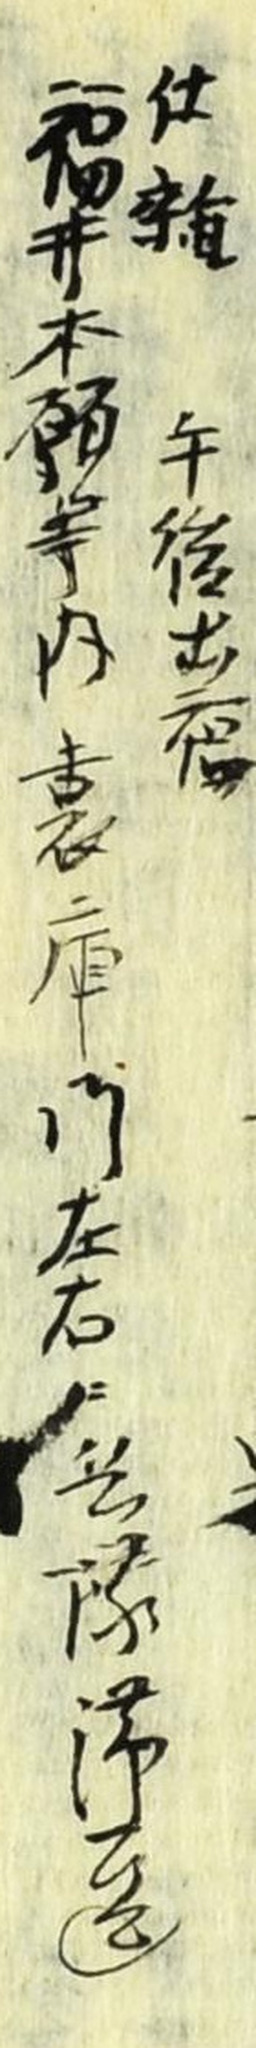福井本願寺内裏庫門左右ニ兵隊滞逗
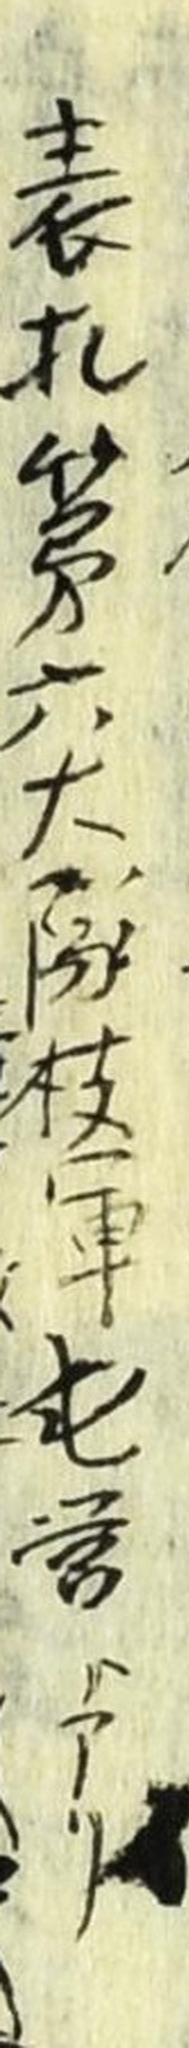表札第六大隊枝軍屯営トアリ
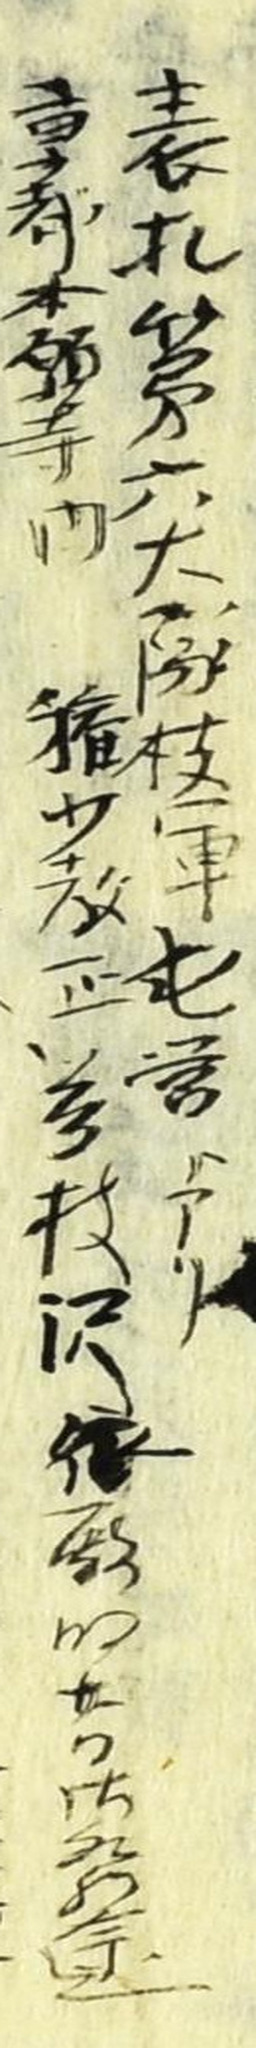京都本願寺内権少教正殿枝沢依殿明廿日御発途
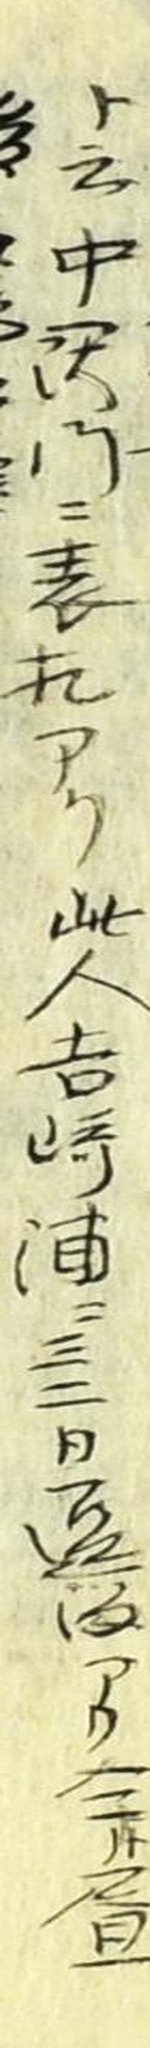ト云中訳門ニ表札アリ此人吉崎浦ニ三二日逗溜アリ今日昼
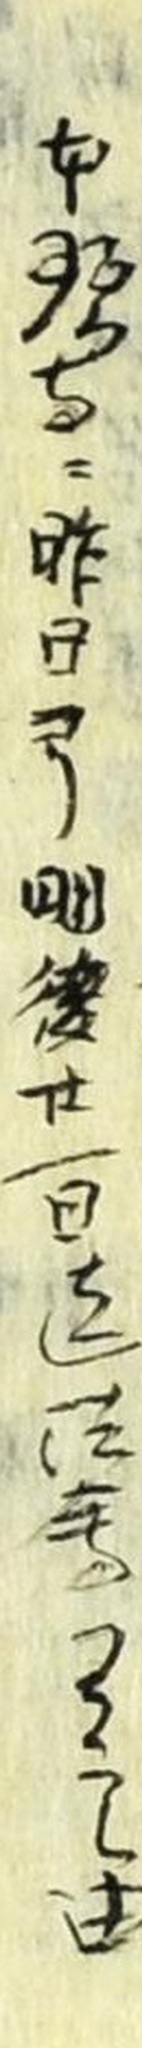本願寺ニ昨日ヨリ明後廿一日迄法会有之由
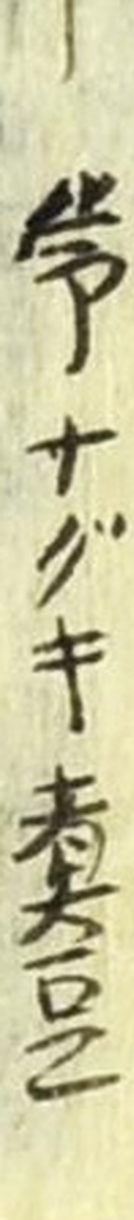中常ナグキ煮豆
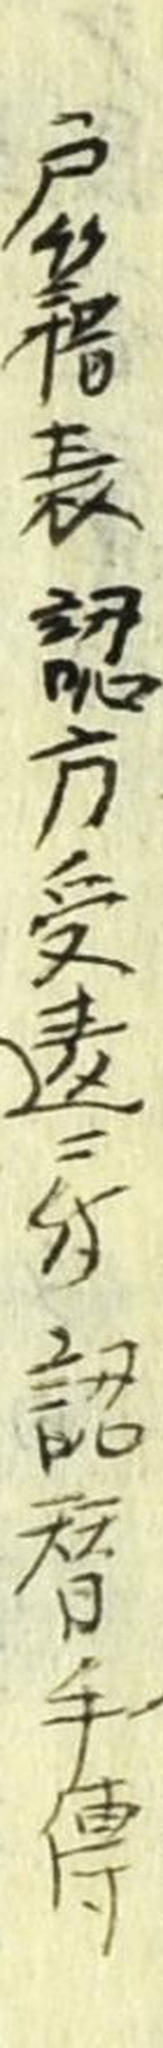戸籍表認方受違ニ付認替手伝
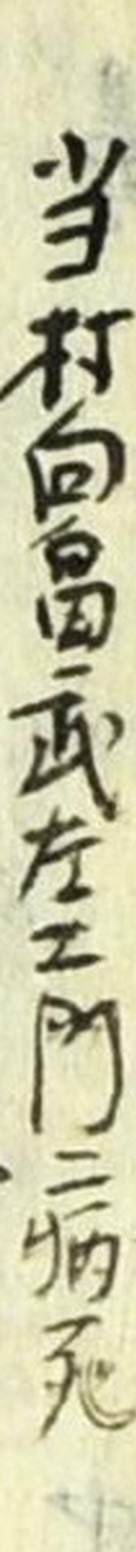当村向畠武左ヱ門病死
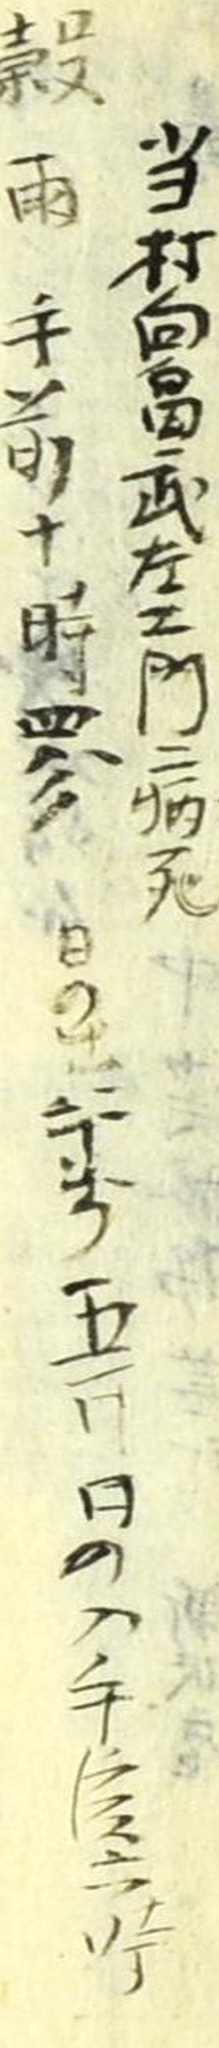穀雨午前十時四分日の出午前五日の入午後六時

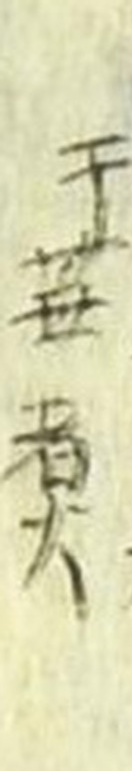干蕪煮
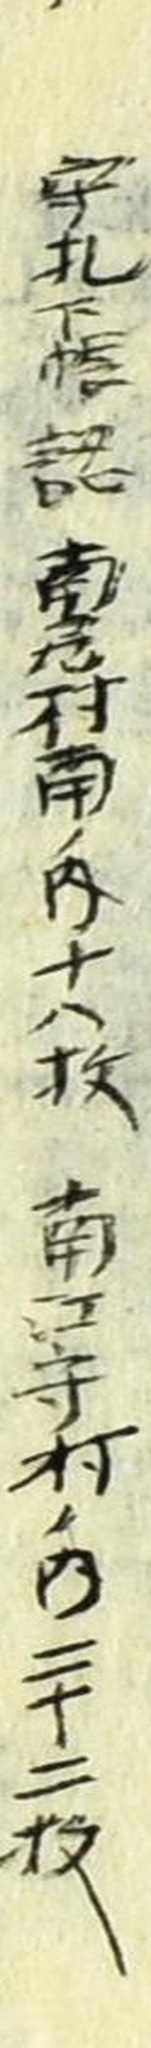守札下帳認南居村南ノ内十八枚南江守村ノ内二十二枚
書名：（日記）
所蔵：福井県文書館 Fukui Prefectural Archives
